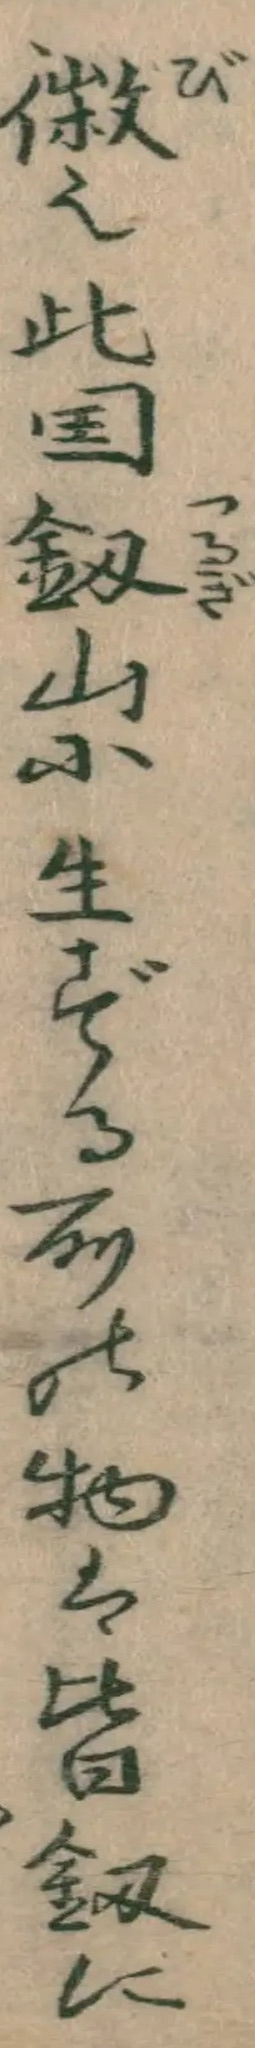微也此国剣山に生ずる所の物は皆剣に
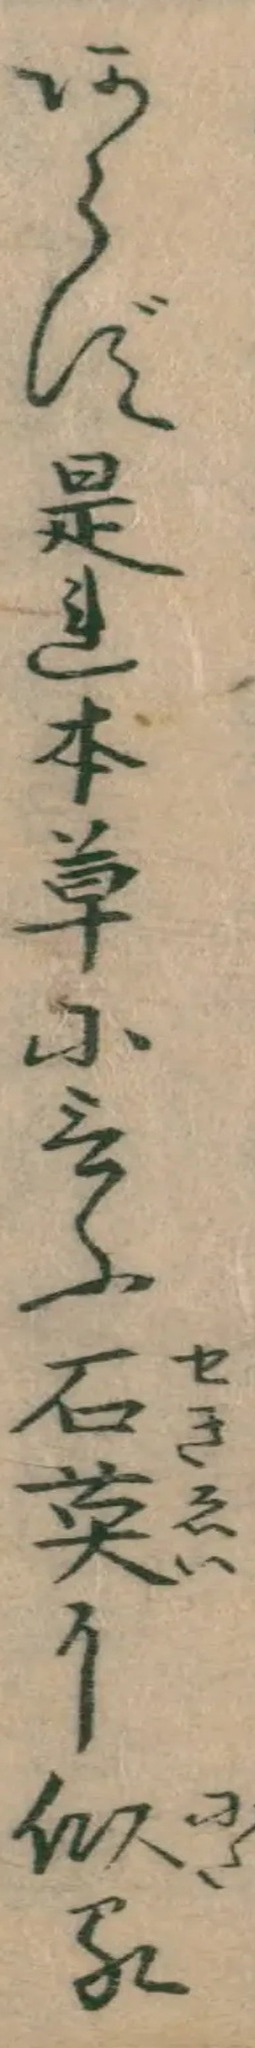あらず是れ本草に言ふ石英に似る
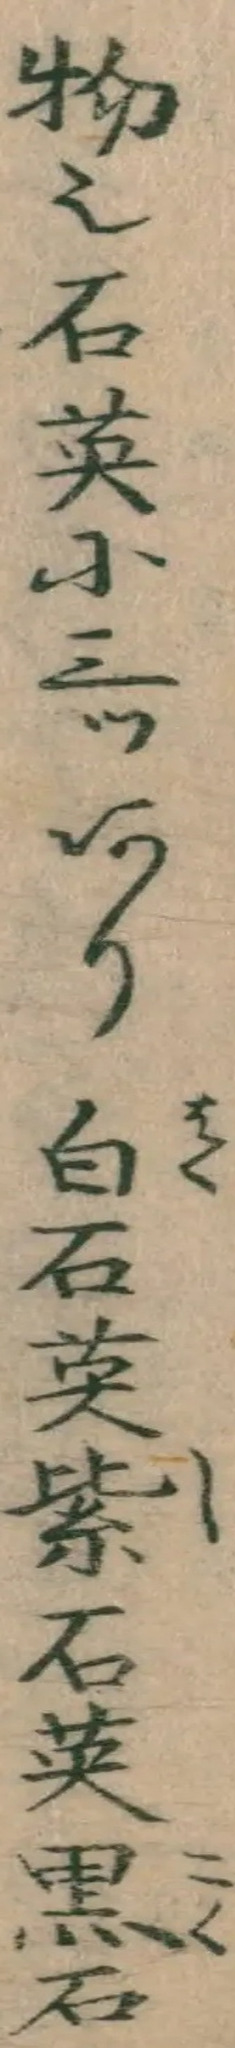物也石英に三ツあり白石英紫石英黒石
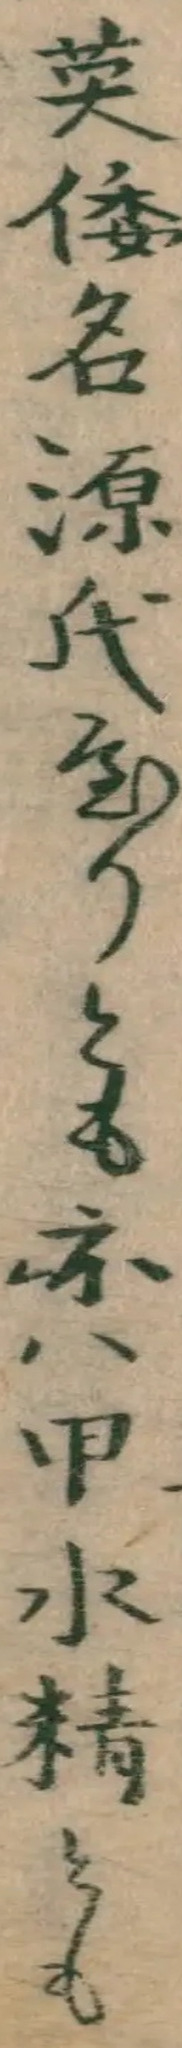英倭名源氏やりとも亦は甲水精とも
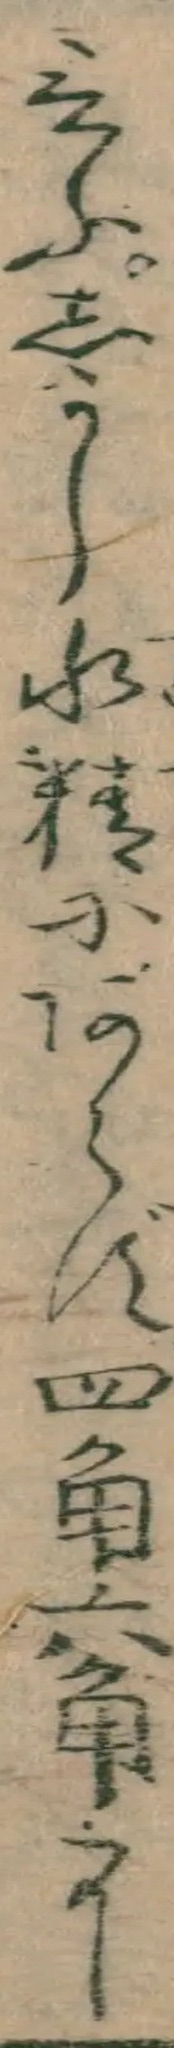言ふ。しかし水精にあらず。四角六角に
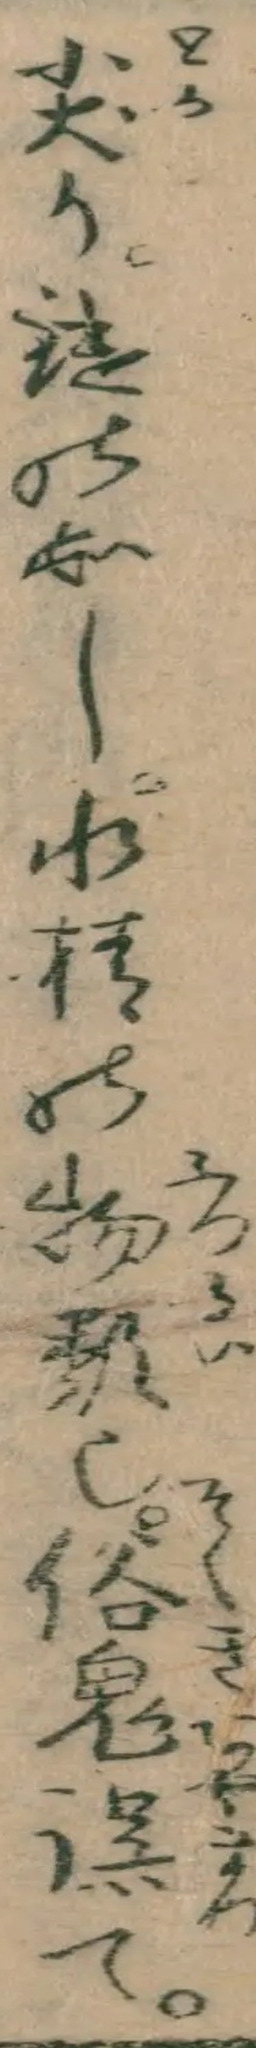尖り。鑓の如し。水精の物類也。俗鬼誤て。
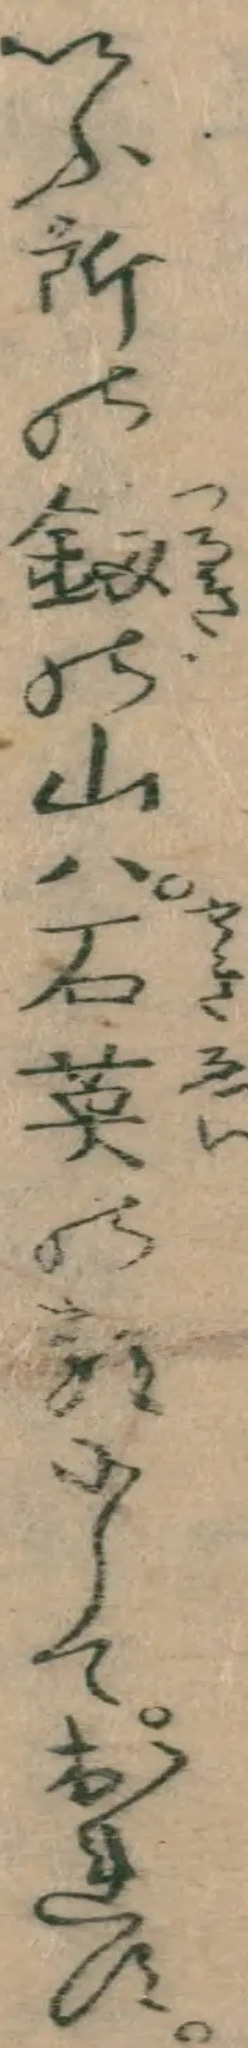いふ所の剣の山は。石英の類にして。おれす。
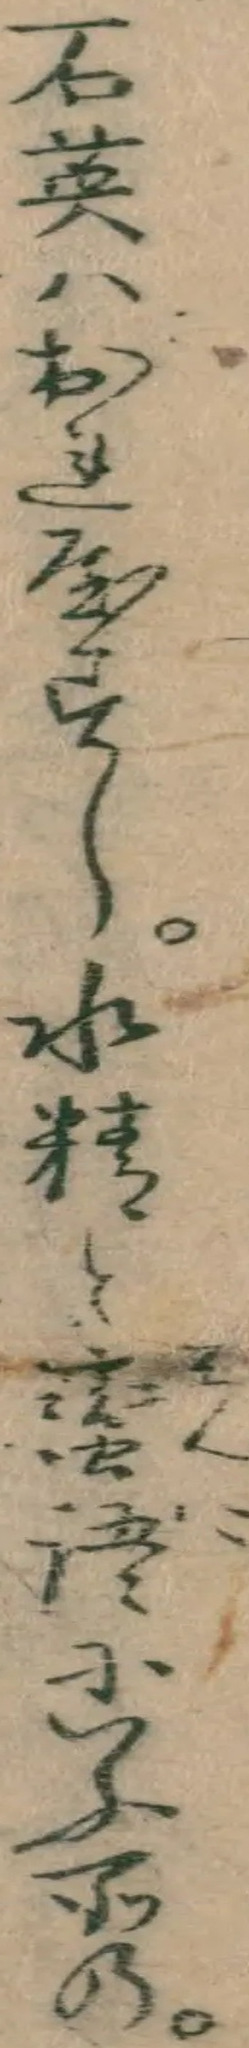石英はおれやすし。水精と蛮語にいふ所の。
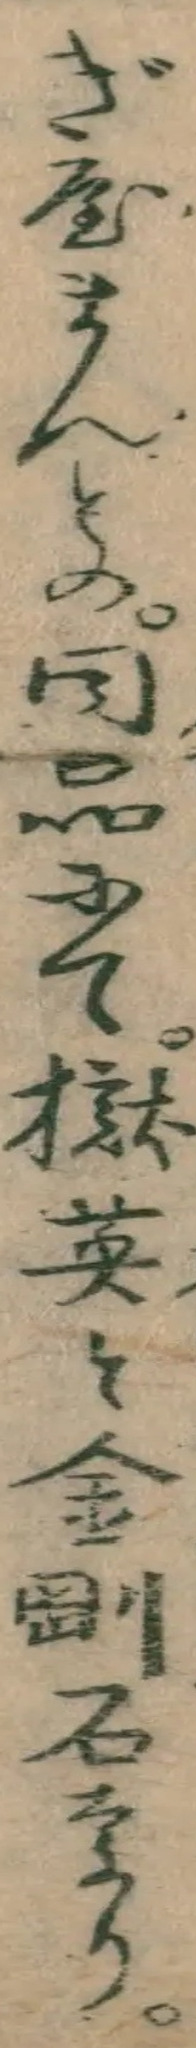ぎやまんとの。同品にて。獄英と金剛石なり。
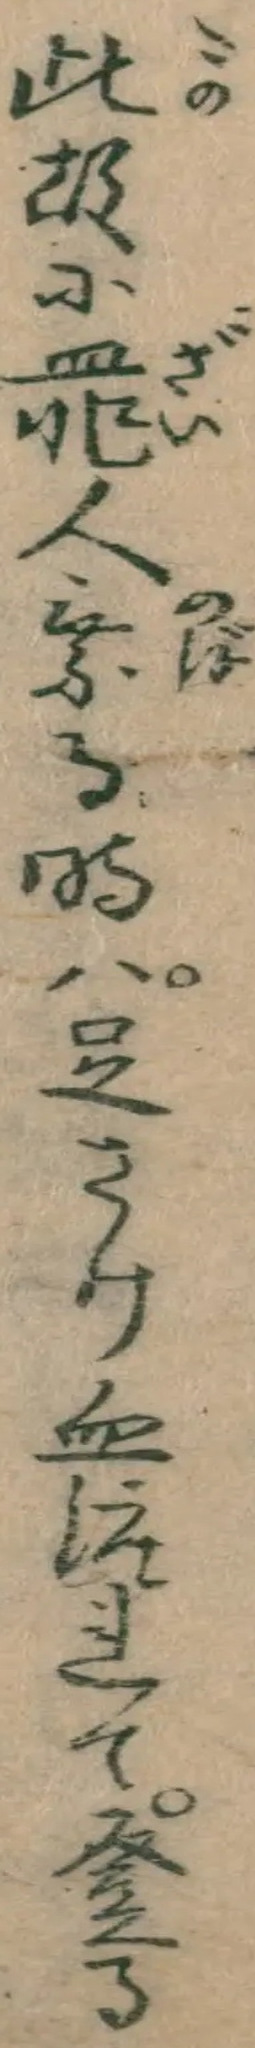此故に罪人乗る時は。足さけ血流れて。登る
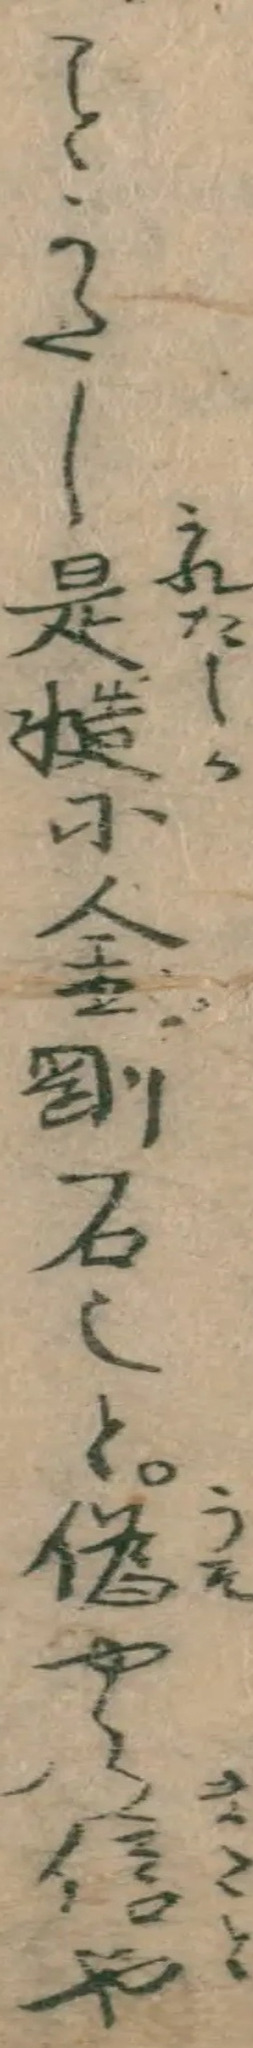ことかたし是慥に金剛石也と。偽やら信や
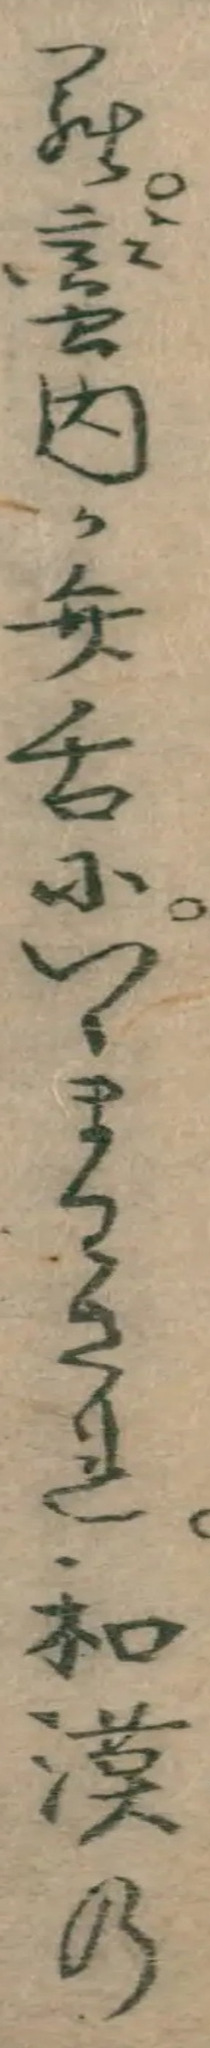ら。蛮内か弁舌に。いゝまわされ。和漢の

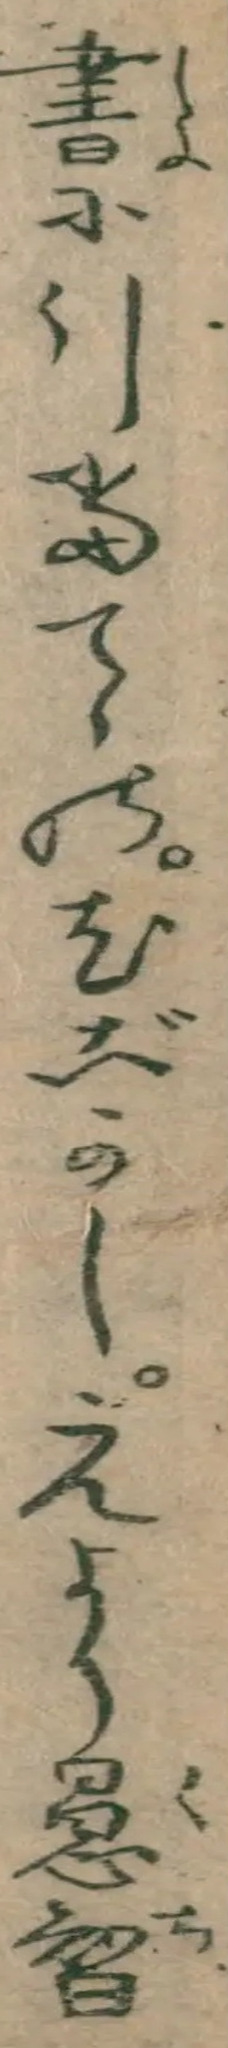書に引当てゝの。尤ごかし。元より愚智
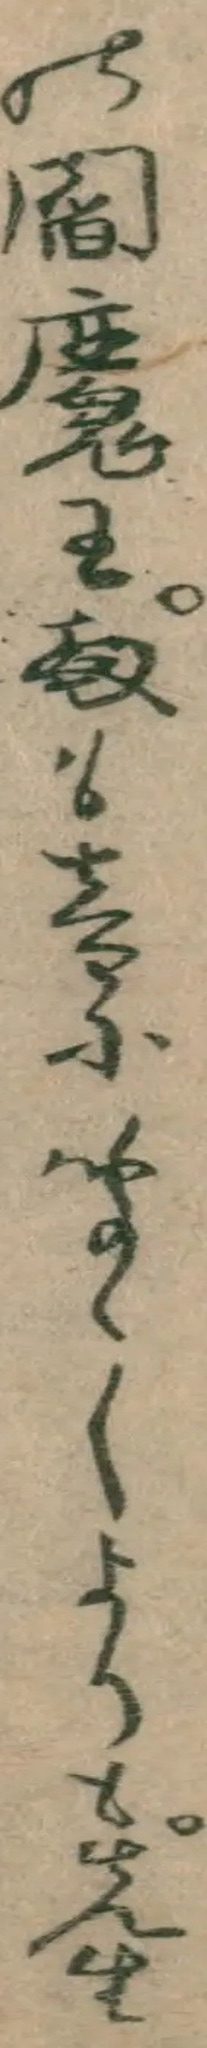の閻魔王。扨も音に聞ゝしよりも。先生
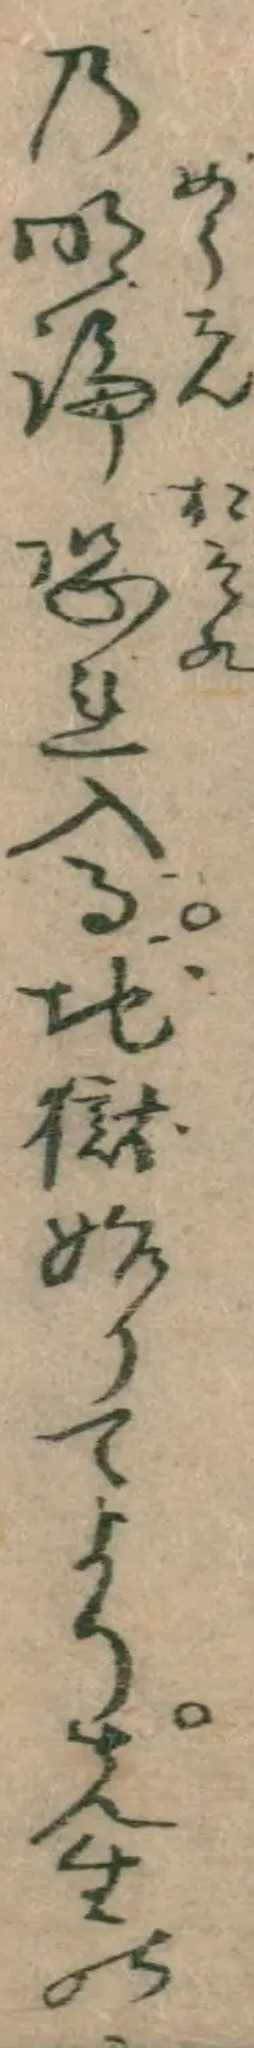の明論恐れ入る。地獄始りてより。先生の
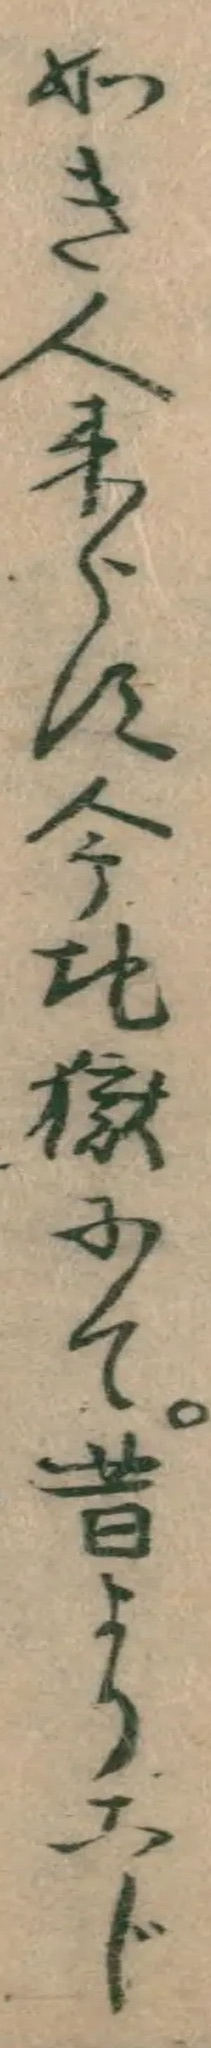如き人来らす今地獄にて。昔よりこじ
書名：翻草盲目
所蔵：国立国会図書館 National Diet Library, JAPAN
